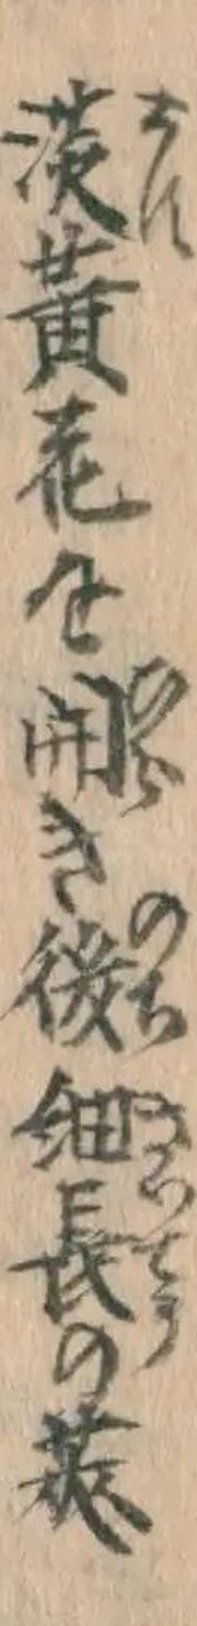淡黄花を開き後細長の莢
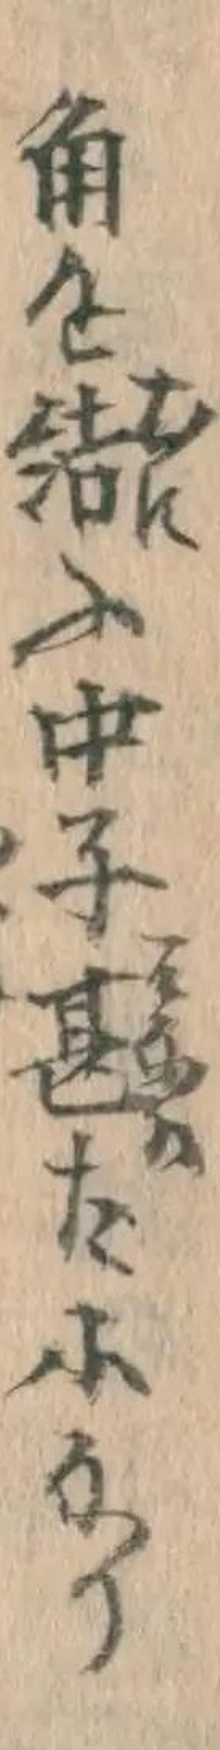角を結ふ中子甚た小なり
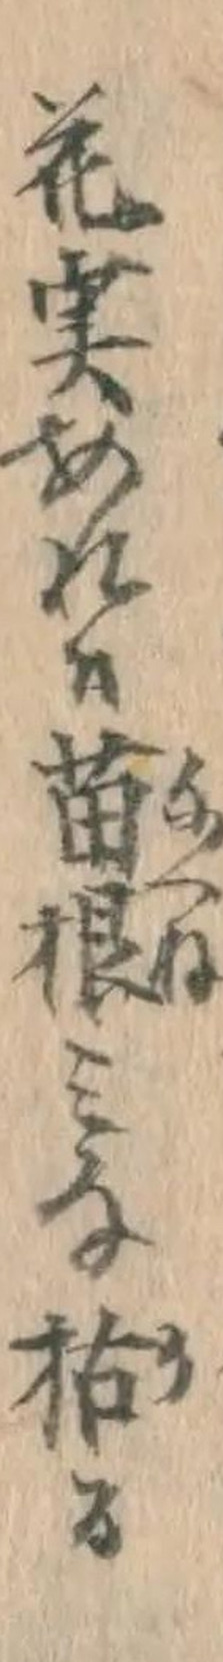花実あれは苗根みな枯る

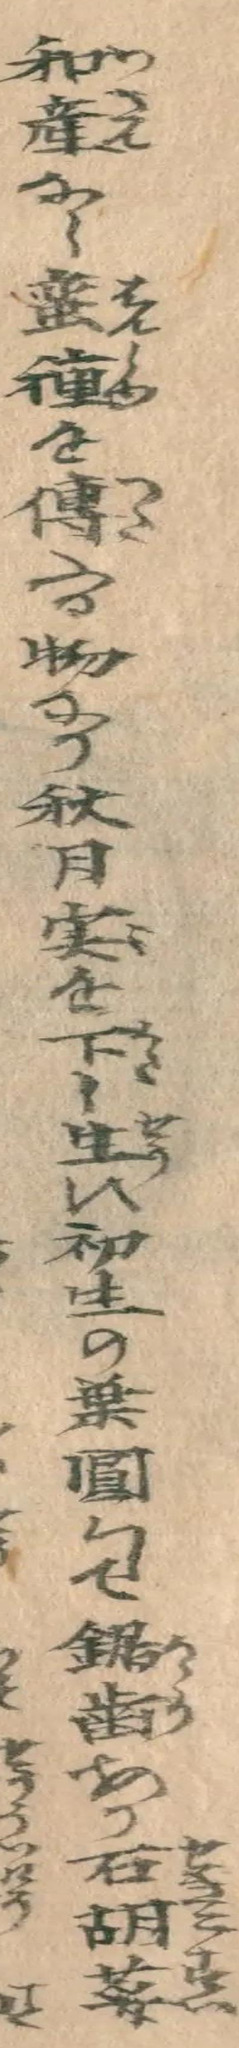和産なし蛮種を伝ふる物なり秋月実を下し生す初生の葉円くして鋸歯あり石胡荽
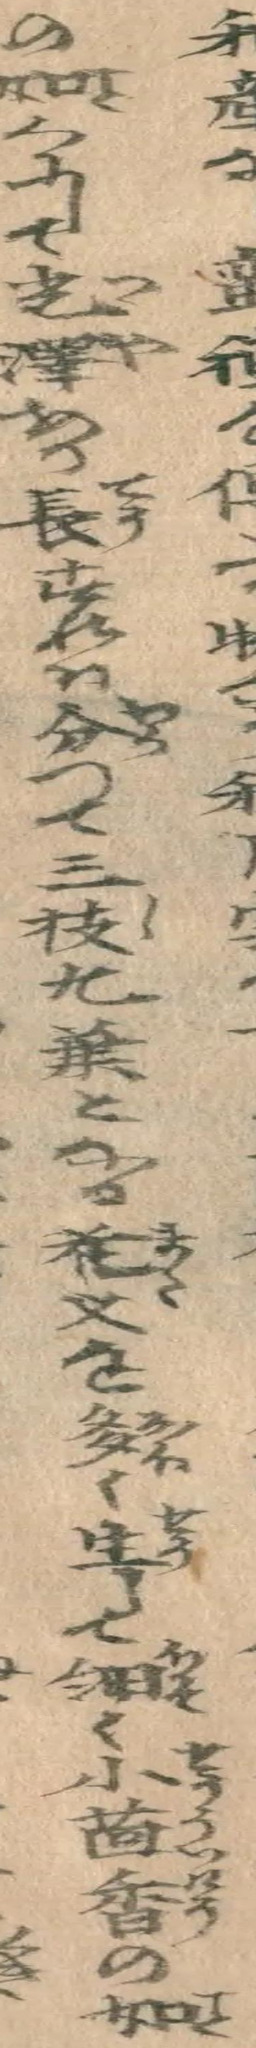の如くにして光沢あり長すれは分つて三枝九葉となる花叉を多く生して細く小茴香の如
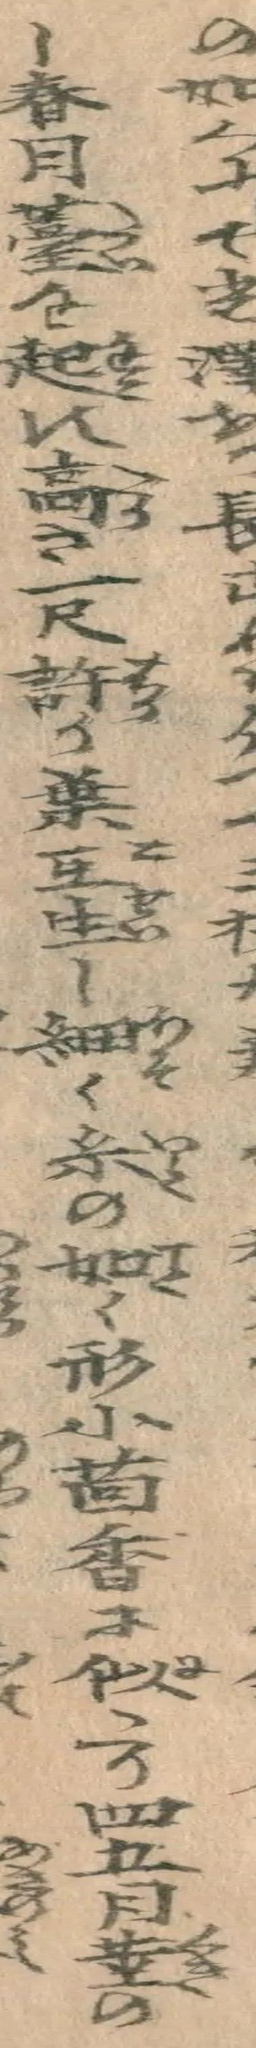し春月薹を起す高さ一尺許り葉互生し細く糸の如く形小茴香に似たり四五月茎の
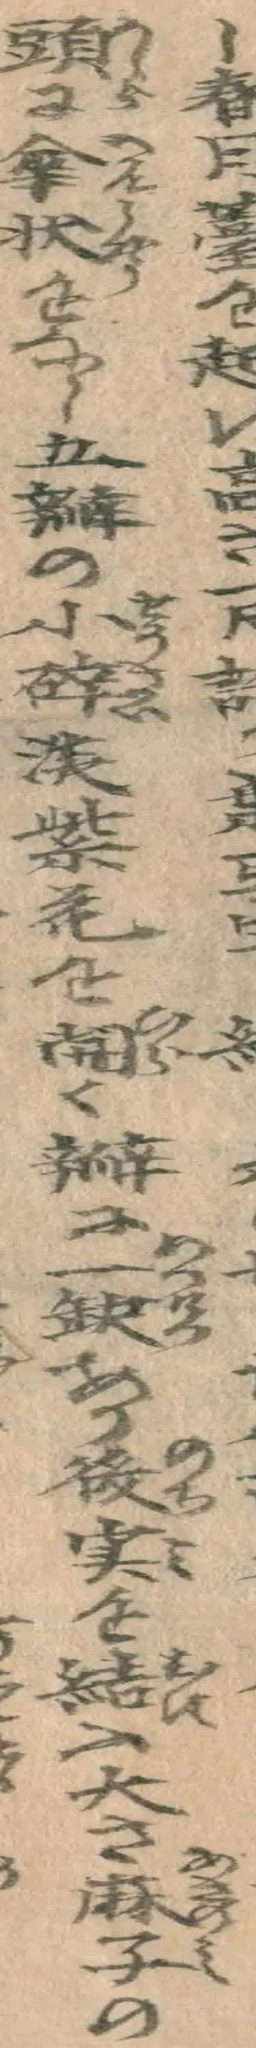頭に傘状をなし五弁の小砕淡紫花を開く弁に一欠あり後実を結ふ大さ麻子の
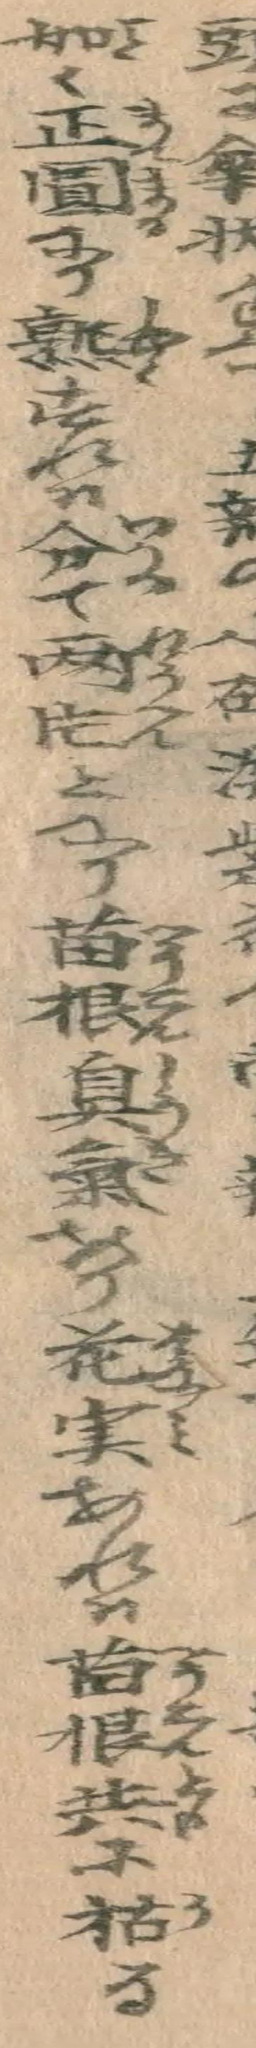如く正円なり熟すれは分て両片となり苗根臭気あり花実あれは苗根共に枯る

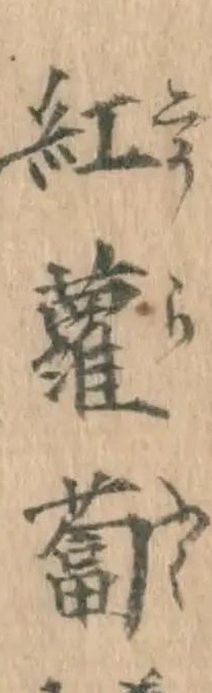砂蘿蔔
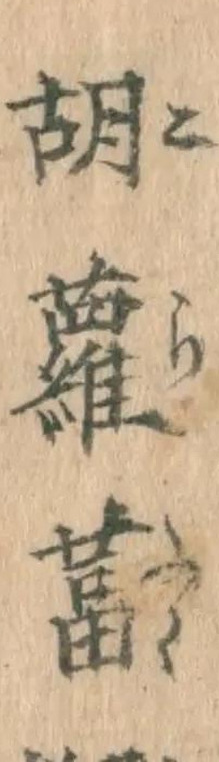砂蘿蔔
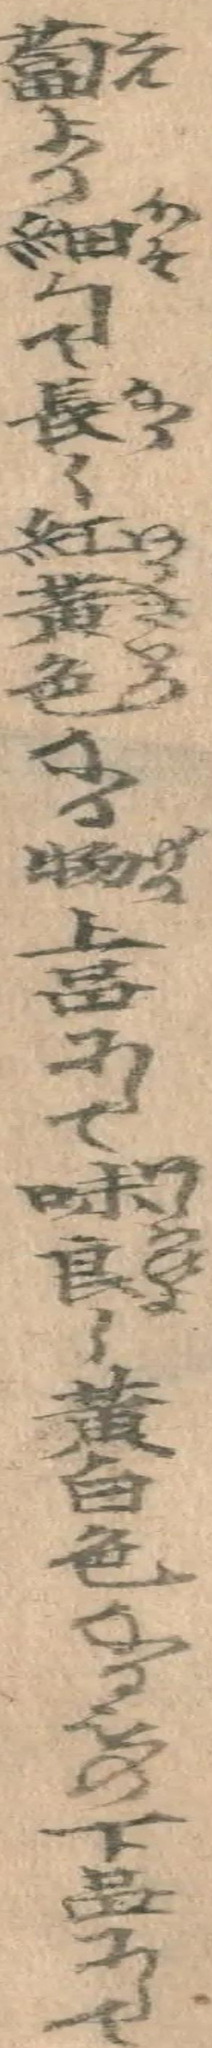蔔より細くして長く紅黄色なる物上品にして味良し黄白色なるもの下品にして
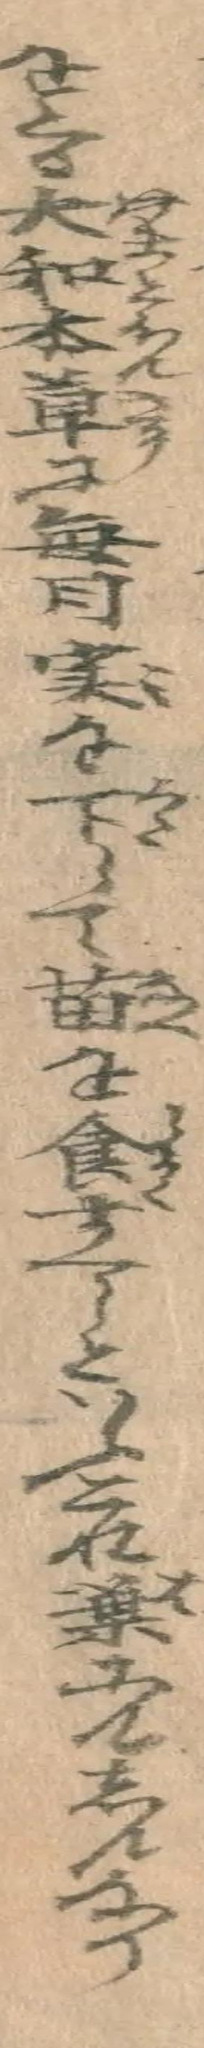をとる大和本草に毎月実を下して苗を食すへしといふこれ葉にんしんなり
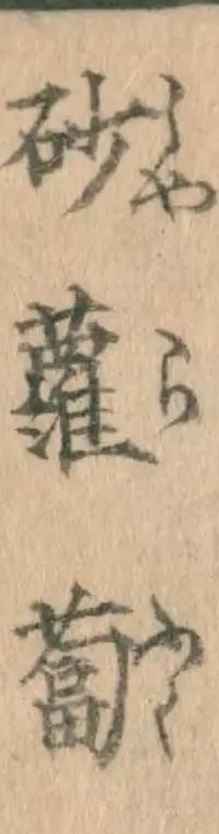砂蘿蔔
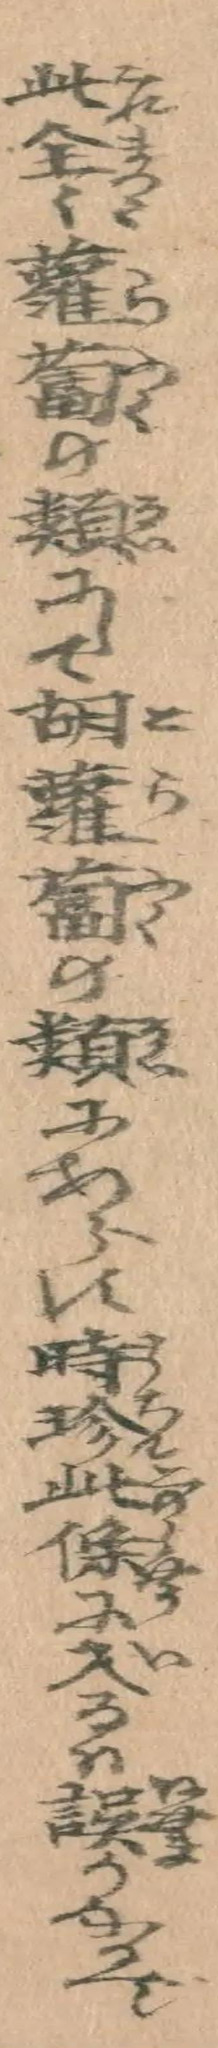此全く蘿蔔の類にして胡蘿蔔の類にあらす時珍此条に入るは誤りなるへし
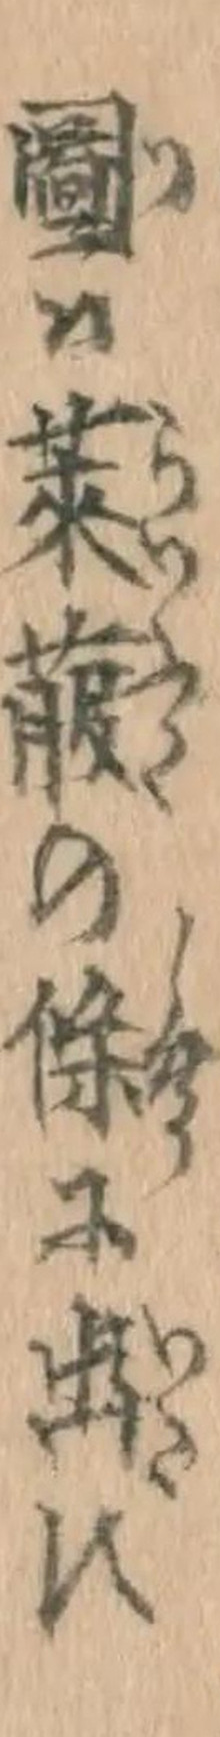図は莱菔の条に出す

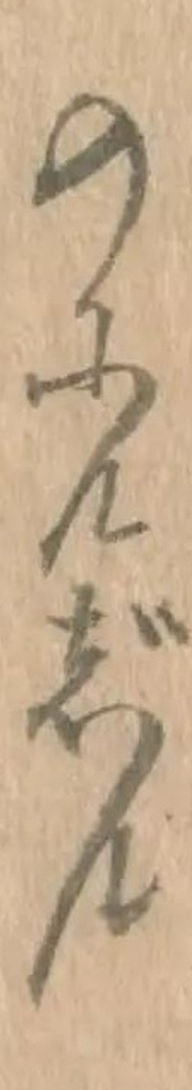のにんじん
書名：本草図譜. 巻46-48
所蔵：国立国会図書館 National Diet Library, JAPAN
